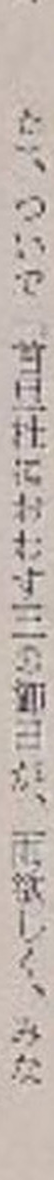た)、ついで「首里杜におわす王の御田が、雨欲しく、みな
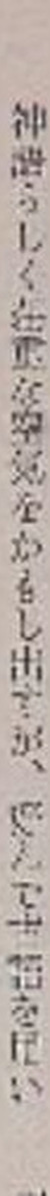神語らしく荘重な空気をかもし出すが、好んで古語を用い
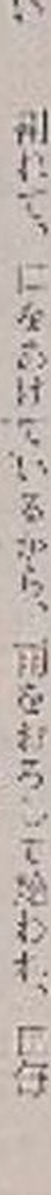れて、口をあけているから、雨をおろして給われ、田毎
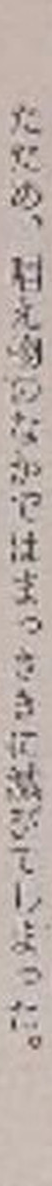たため、唱え物のなかではまっさきに滅びてしまった。
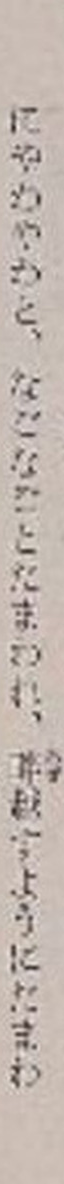にやわやわと、なごなごとたまわれ、畔越すようにたまわ
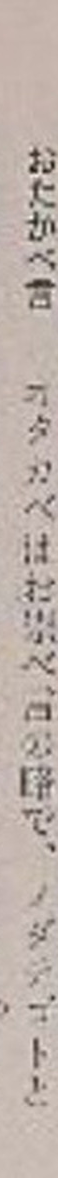おたかべ言オタカベはお崇べ言の略で、ノダテゴトと
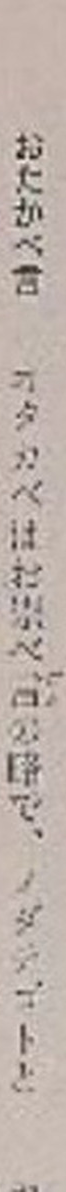おたかべ言オタカベはお崇べ言の略で、ノダテゴトと
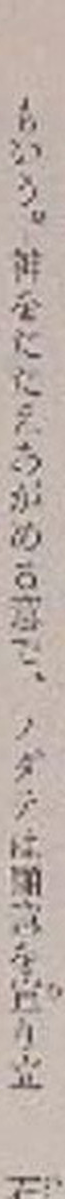もいう。神をたたえあがめる意で、ノダテは願意を宣り立
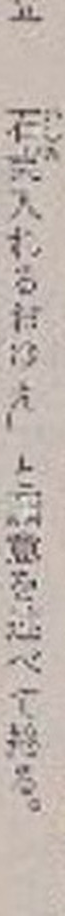石実入れるおゆえ」と願意を述べて終る。
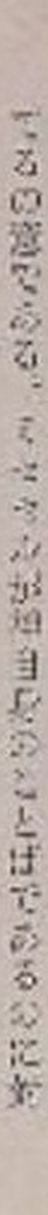てるの意である。ミセセルが神自身のことばであるのに対
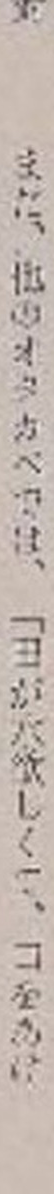また、他のオタカベでは、「田が水欲しくて、口をあけ
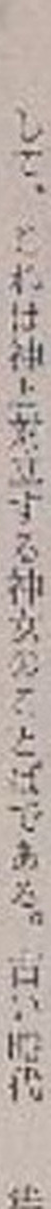して、これは神と対立する神女のことばである。古い時代
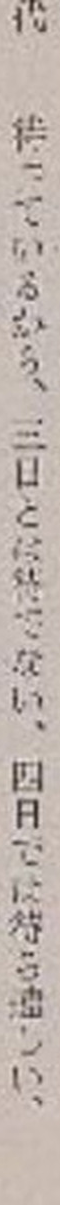待っているから、三日とは待てない、四日では待ち遠しい、
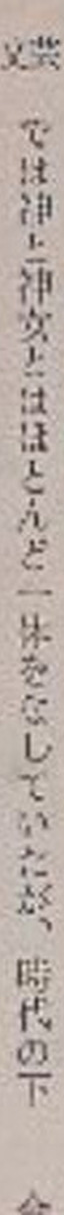では神と神女とはほとんど一体をなしていたが、時代の下
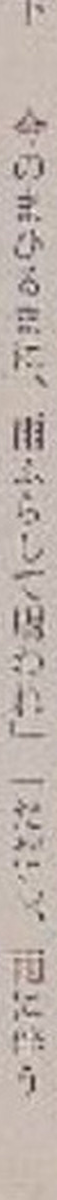今のまひるまに、雨ふらして賜われ」「ただし、雨に伴う
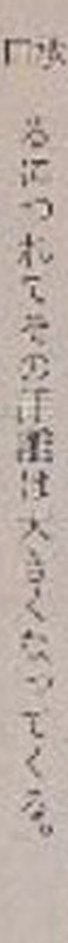るにつれてその離は大きくなってくる。
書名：沖縄口承文芸
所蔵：University of the Ryukyus Library
